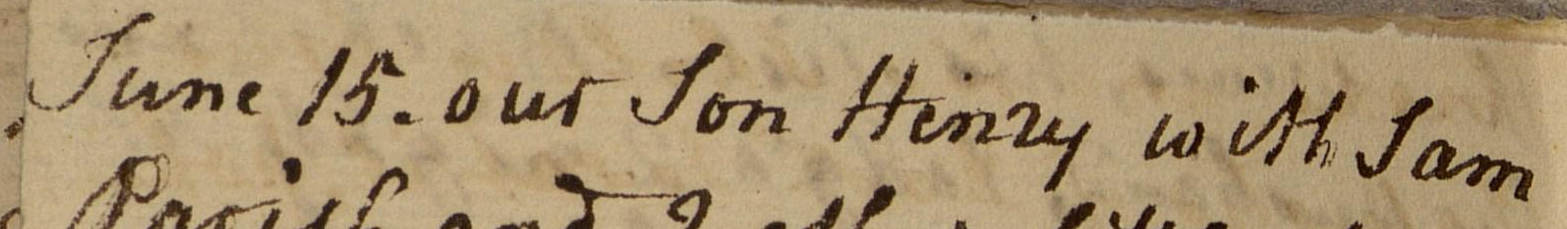June 15. our Son Henry with Sam
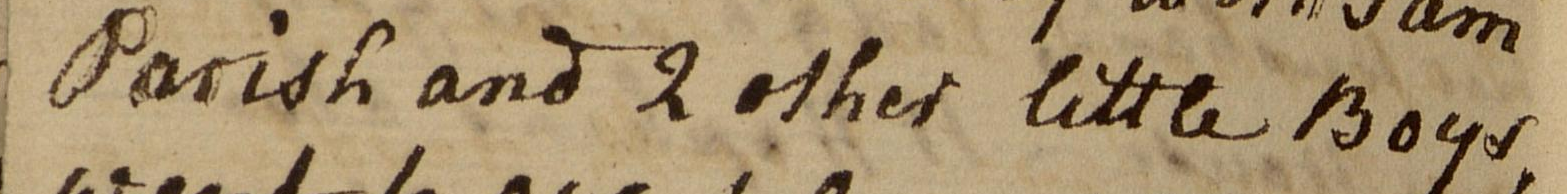Parish and 2 other little Boys,
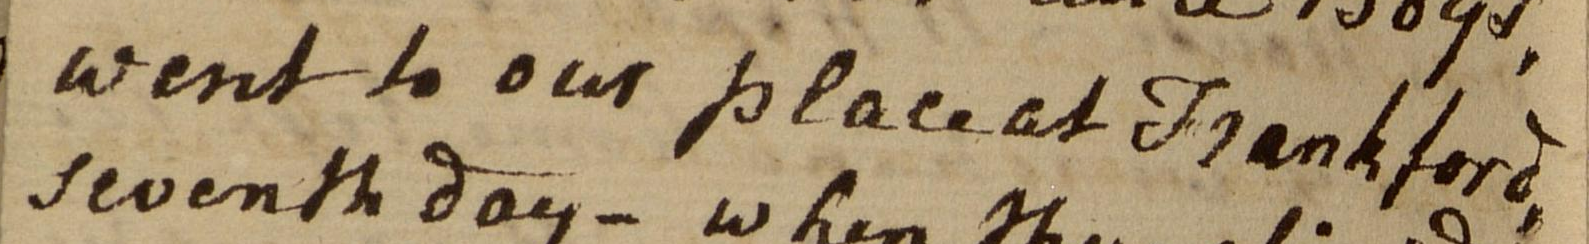went to our place at Frankford,
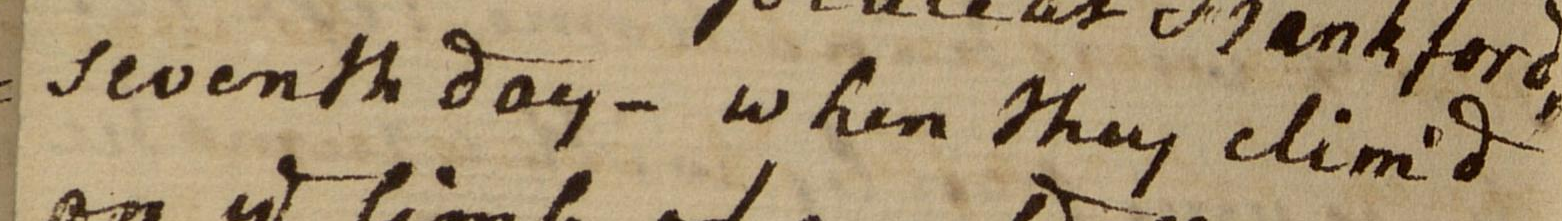seventh day- when they clim'd
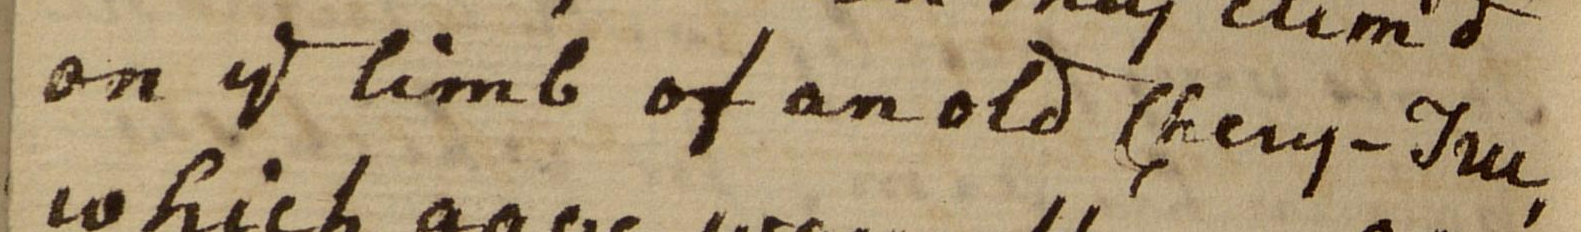on y^e limb of an old Cherry-Tree,
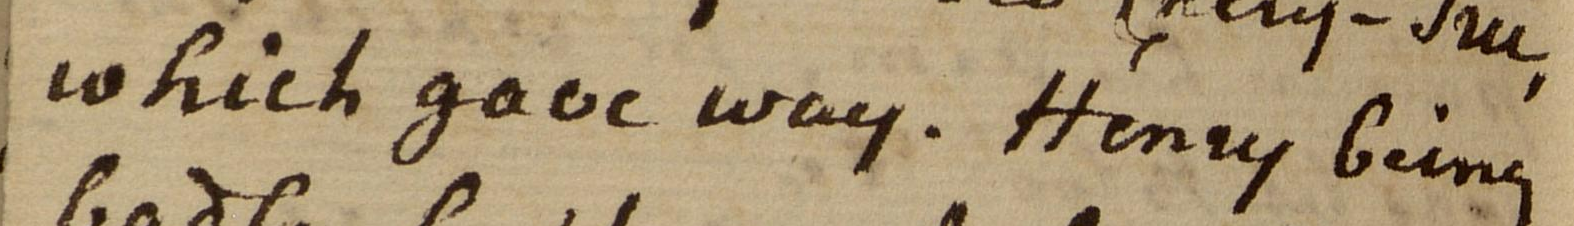which gave way. Henry being
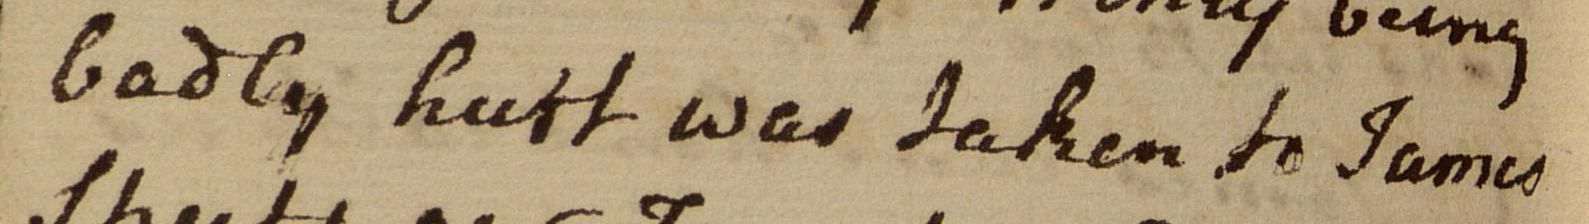badly hurt was taken to James
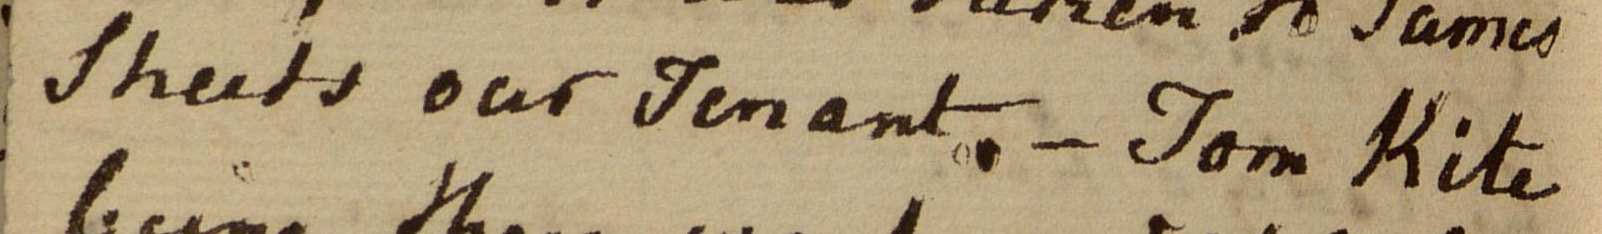Sheets our Tenant-- Tom Kite
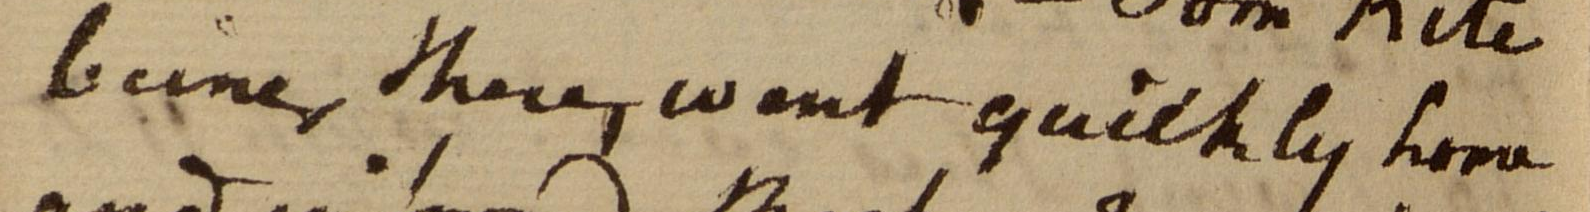being they went quickly home
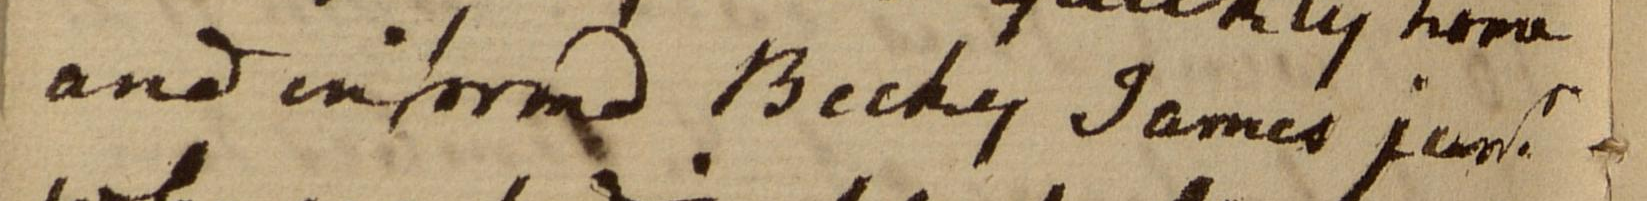and informd Becky James jun^r.
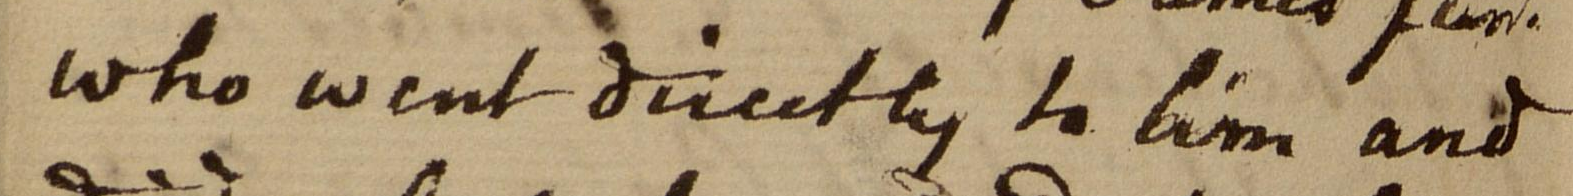who went directly to him and
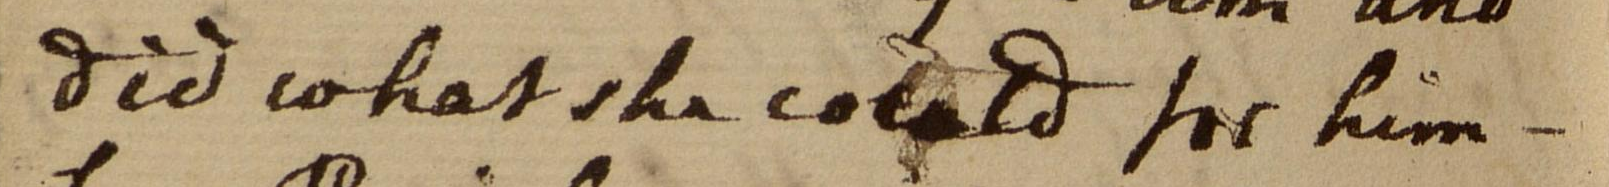did what she could for him-
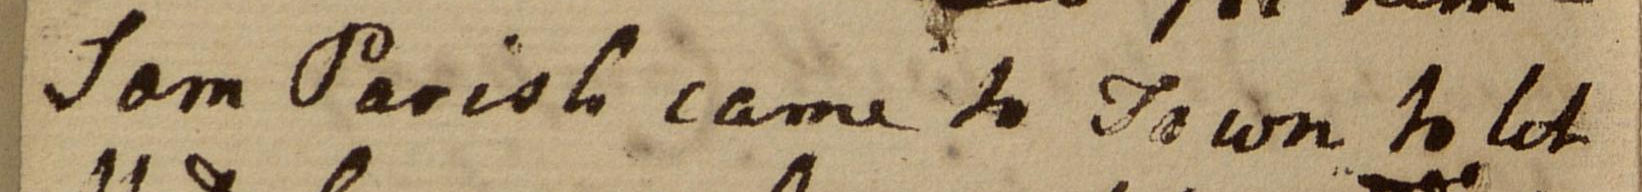Sam Parish came to Town to let
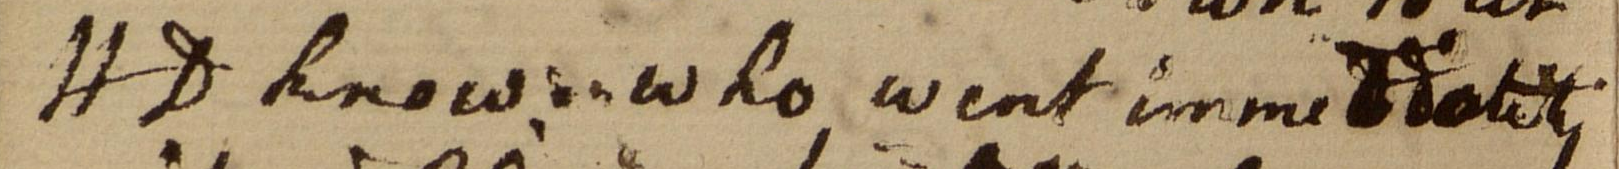HD know, who went immediately
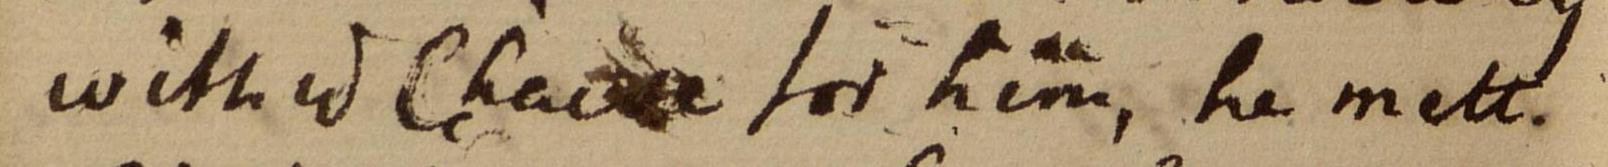with y^e Chaise for him, he mett.
